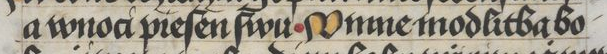a wnoci pieſen ſwu.V mne modlitba bo¬
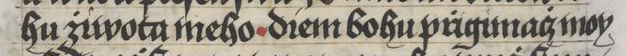hu żiwota meho.díem bohu pṙigimacż moy
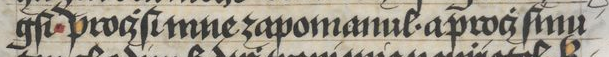gſi.Procżſi mne zapomanul.a procż ſmu¬
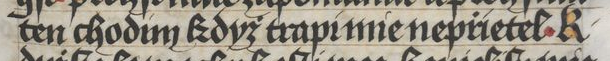ten chodím kdýž trapí mie nepṙíetel.K¬
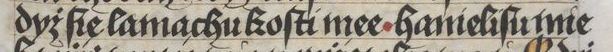dyż ſie lamachu koſti mee.hanieliſu mie
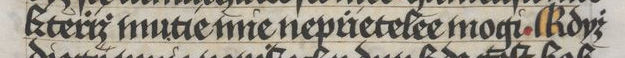kteṙíż mutíe mie nepṙíetelee mogi.Když
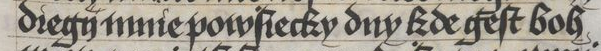diegij mnie powẛiecky dny kde geſt boh
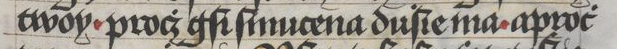twoy.procż gſi ſmucena duẛie ma.aproċ
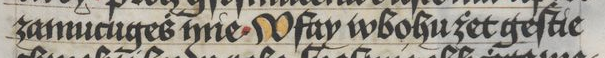zamucugeṡ mie.Vſay wbohu żet geẛtie
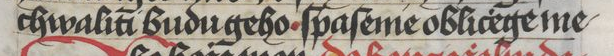chwaliti budu geho.ſpaſenie obliċege me¬
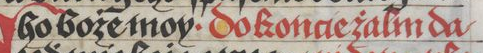ho boże moy.dokoncie žalm da¬
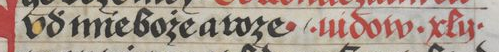Vḋ mie boże a roze.uidow.xlij.
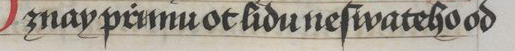znay pṙimu ot lidu neſwateho od
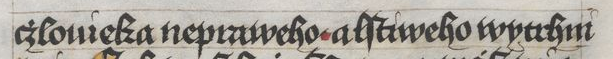cżlouieka nepraweho.a lſtiweho wytrhni
